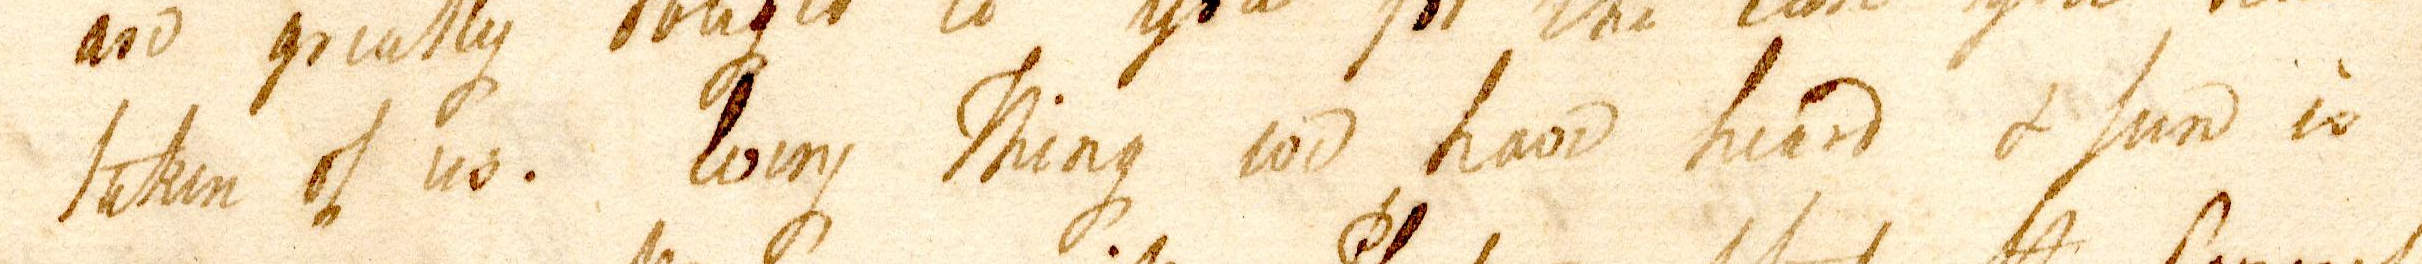taken of us. Every Thing we have heard & seen is
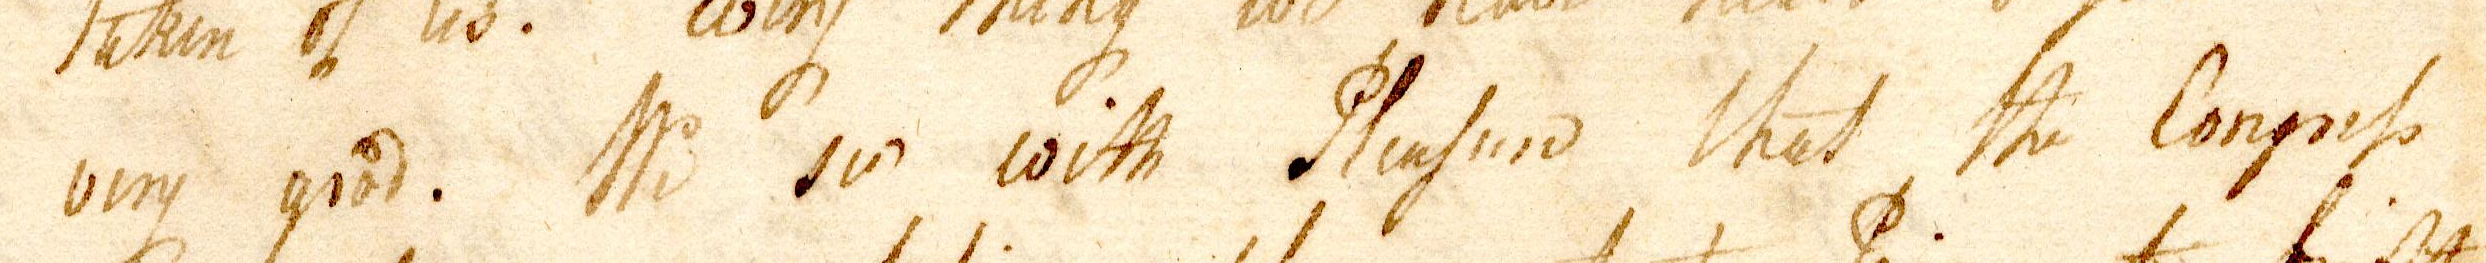very good. We see with Pleasure that the Congress
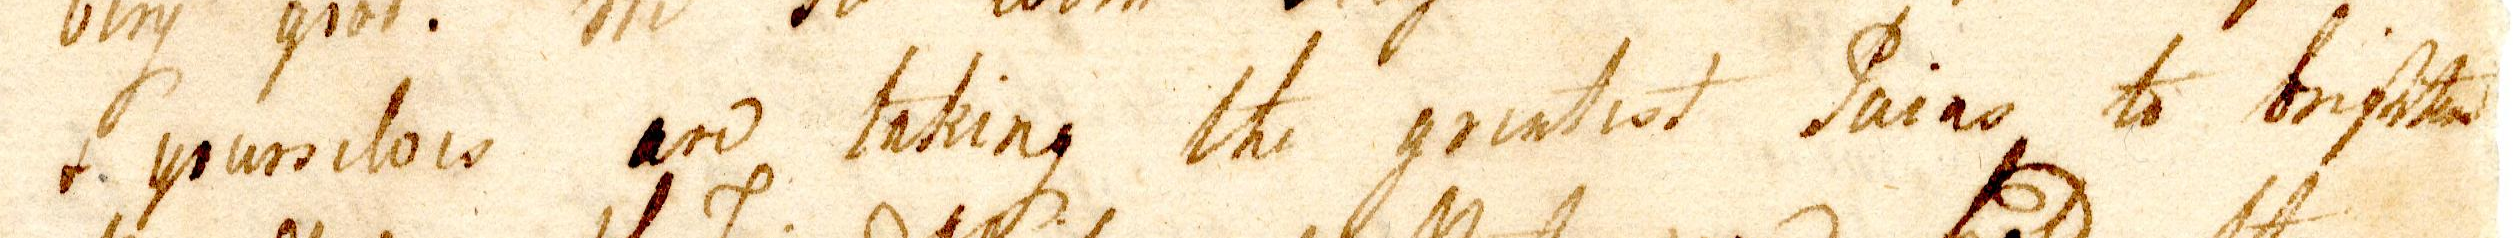& yourselves are taking the greatest Pains to brighten
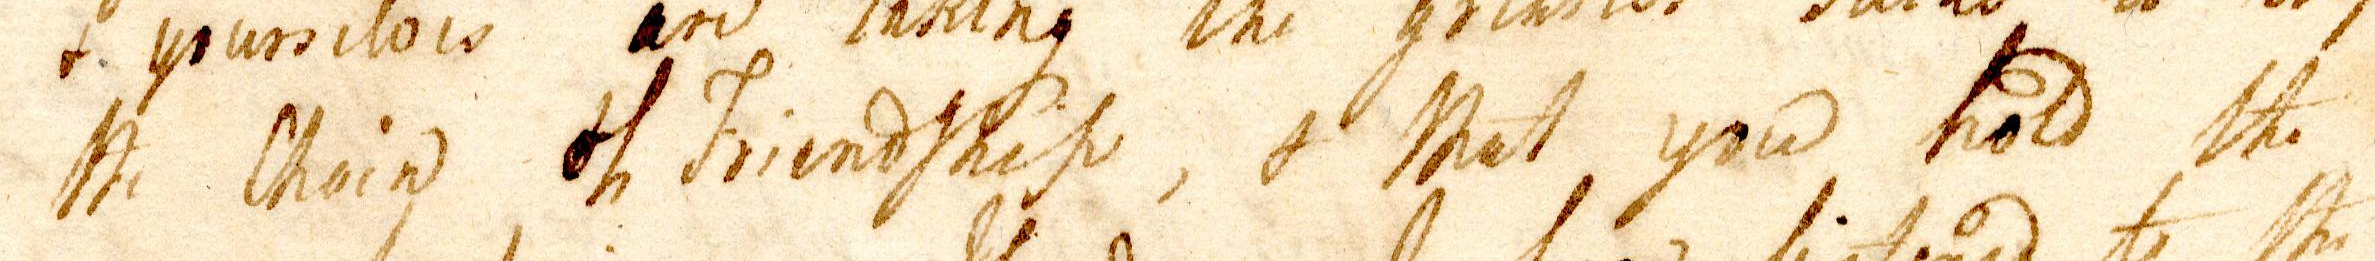the chain of Friendship, & that you hold the
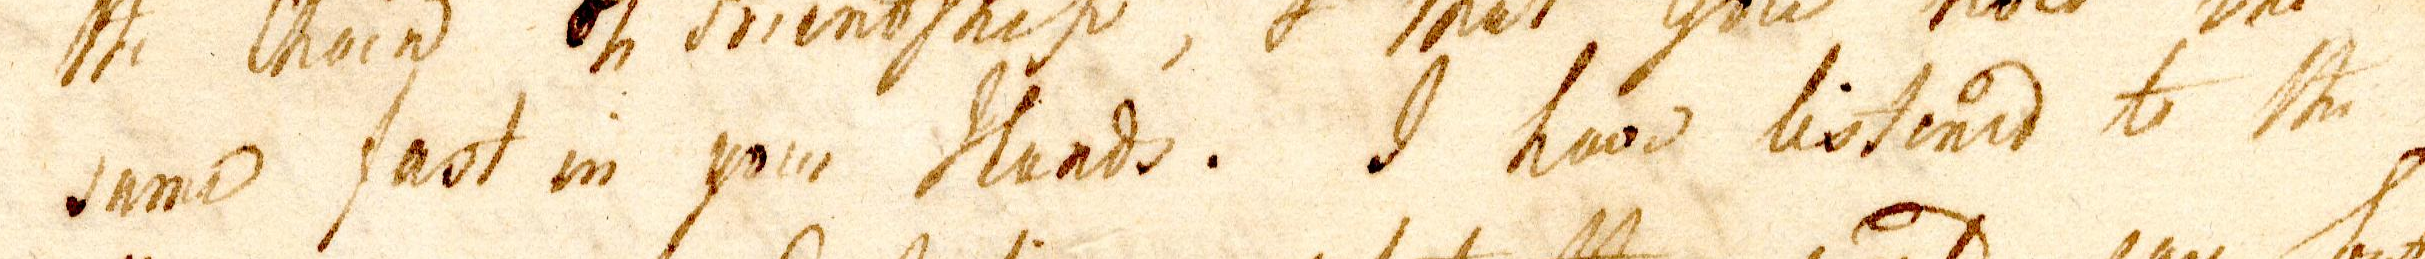same fast in your Hands. I have listened to the
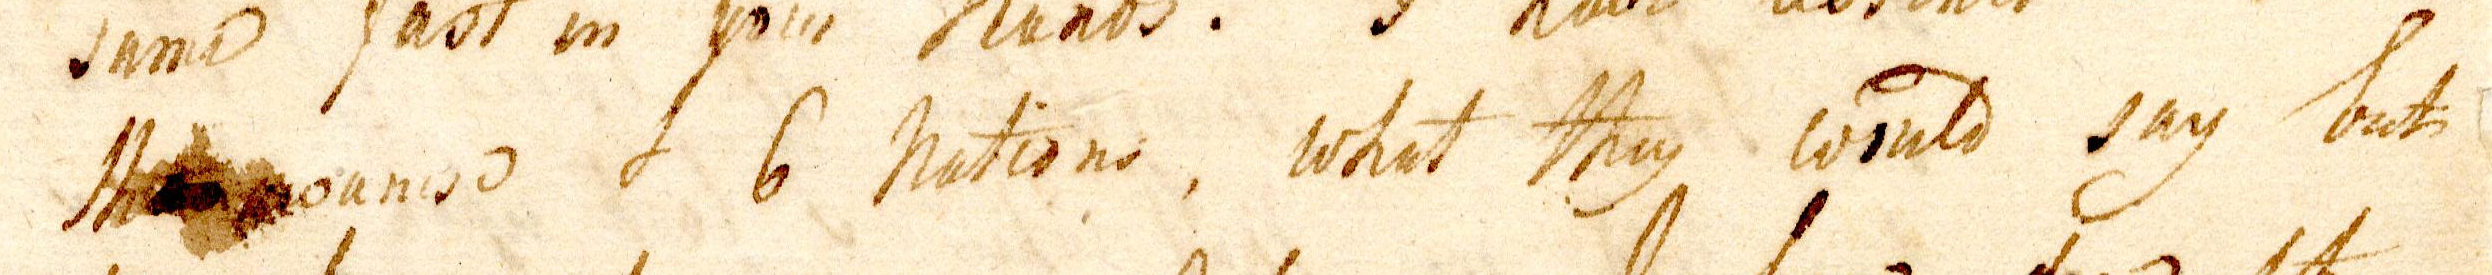Shawanese & 6 Nations, what they would say but
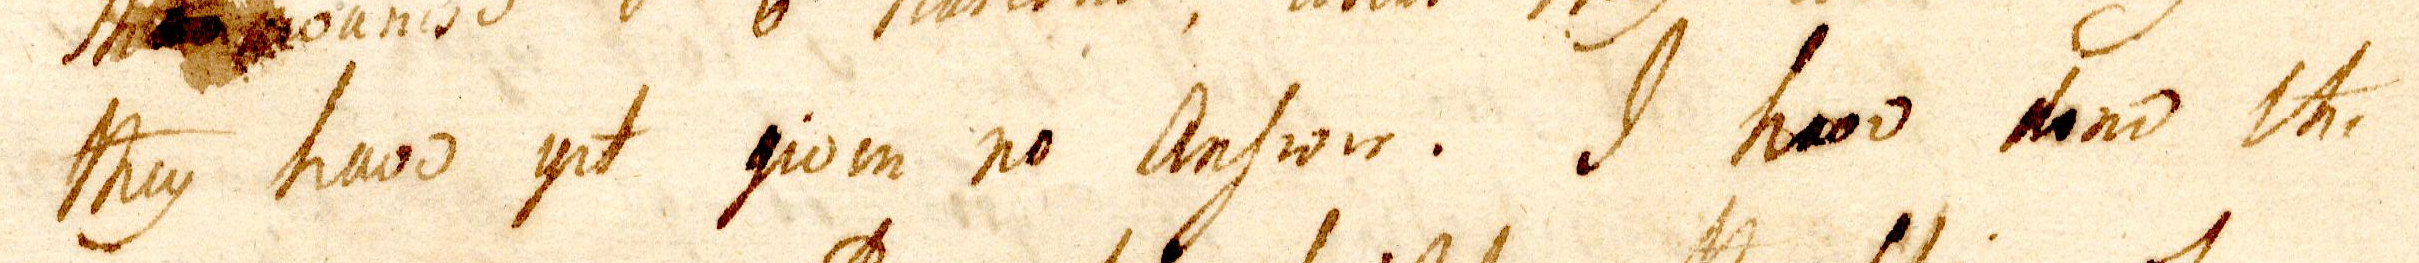they have yet given no Answer. I have done the
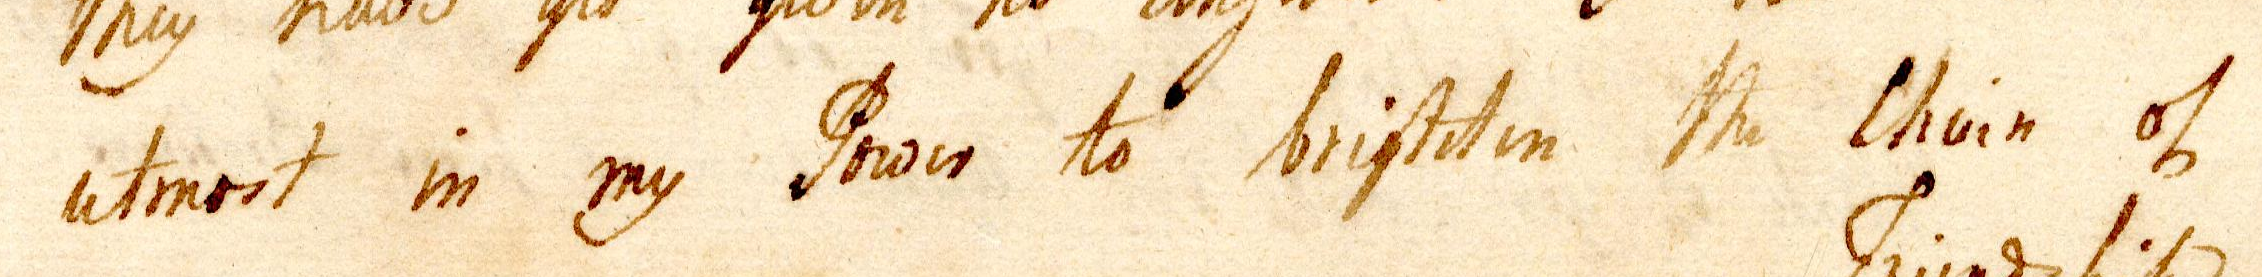utmost in my Power to brighten the Chain of
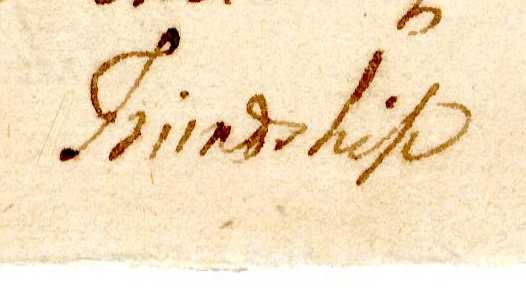Friendship
